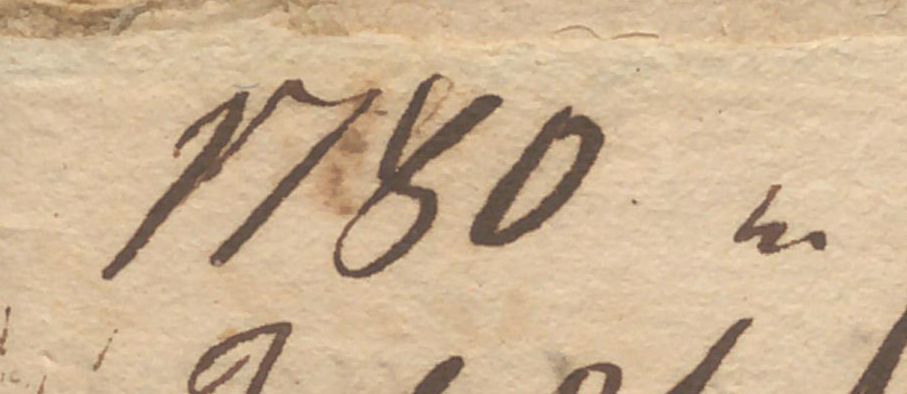1780
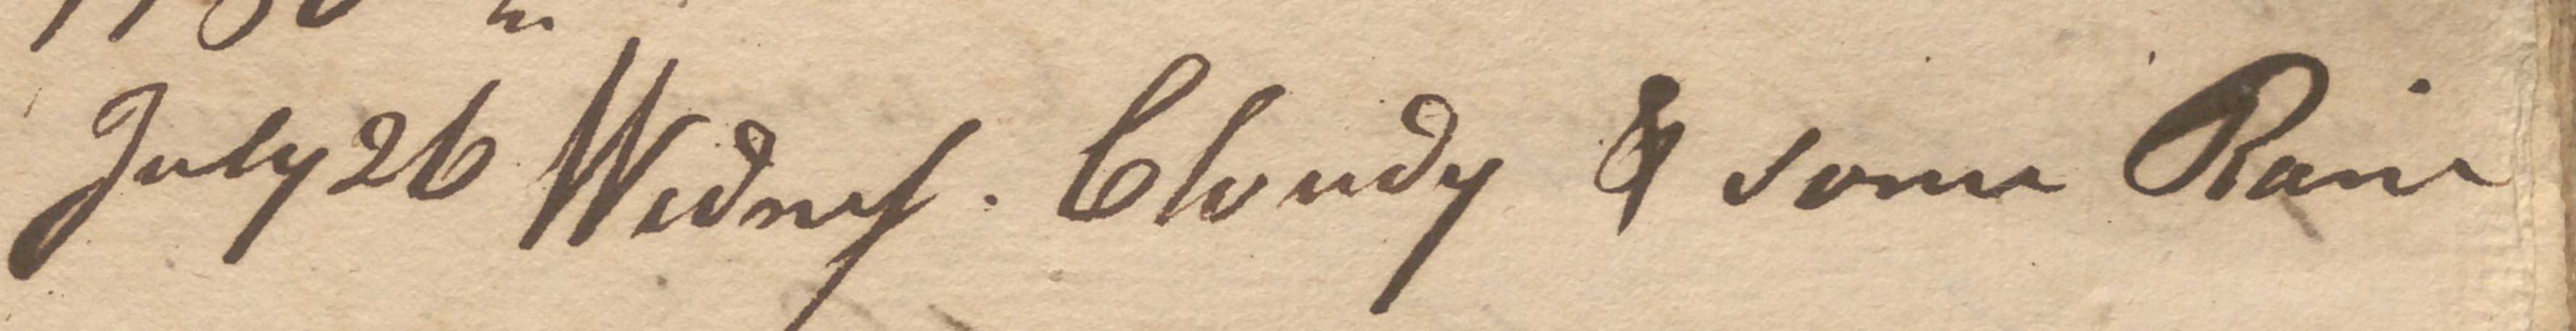July 26^th. Wednes. Cloudy & some Rain
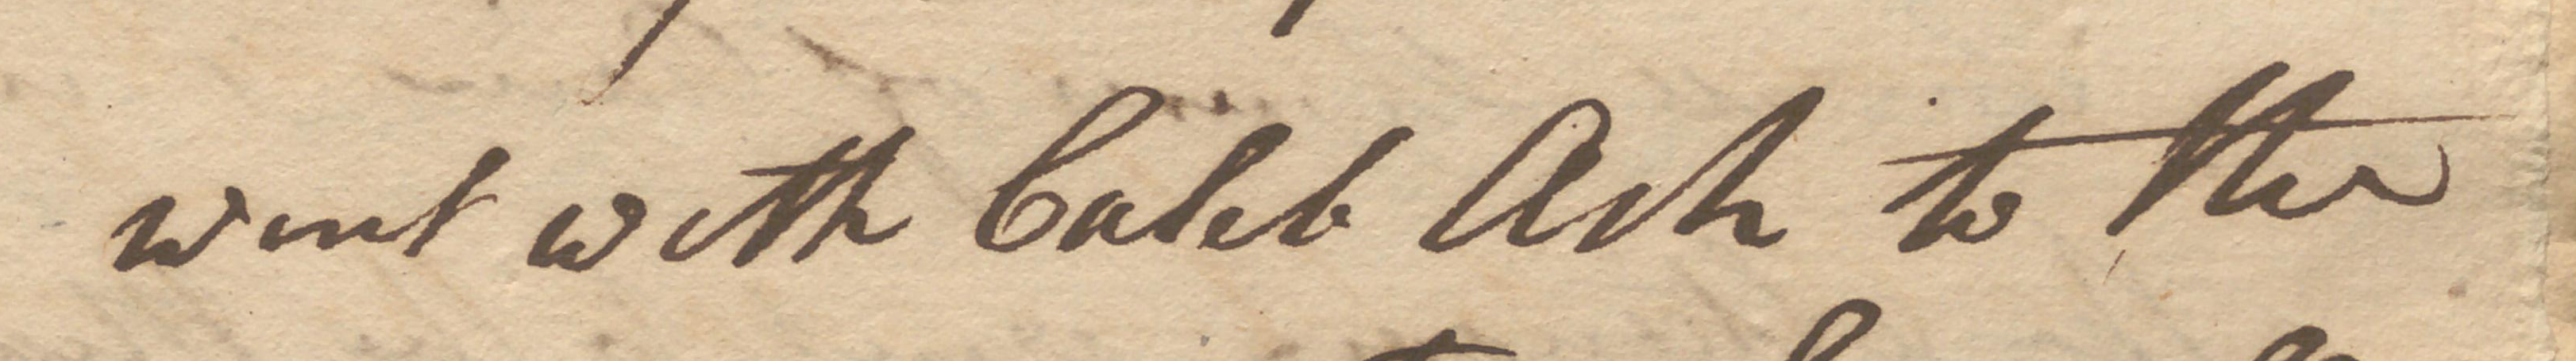went with Caleb Ash to the
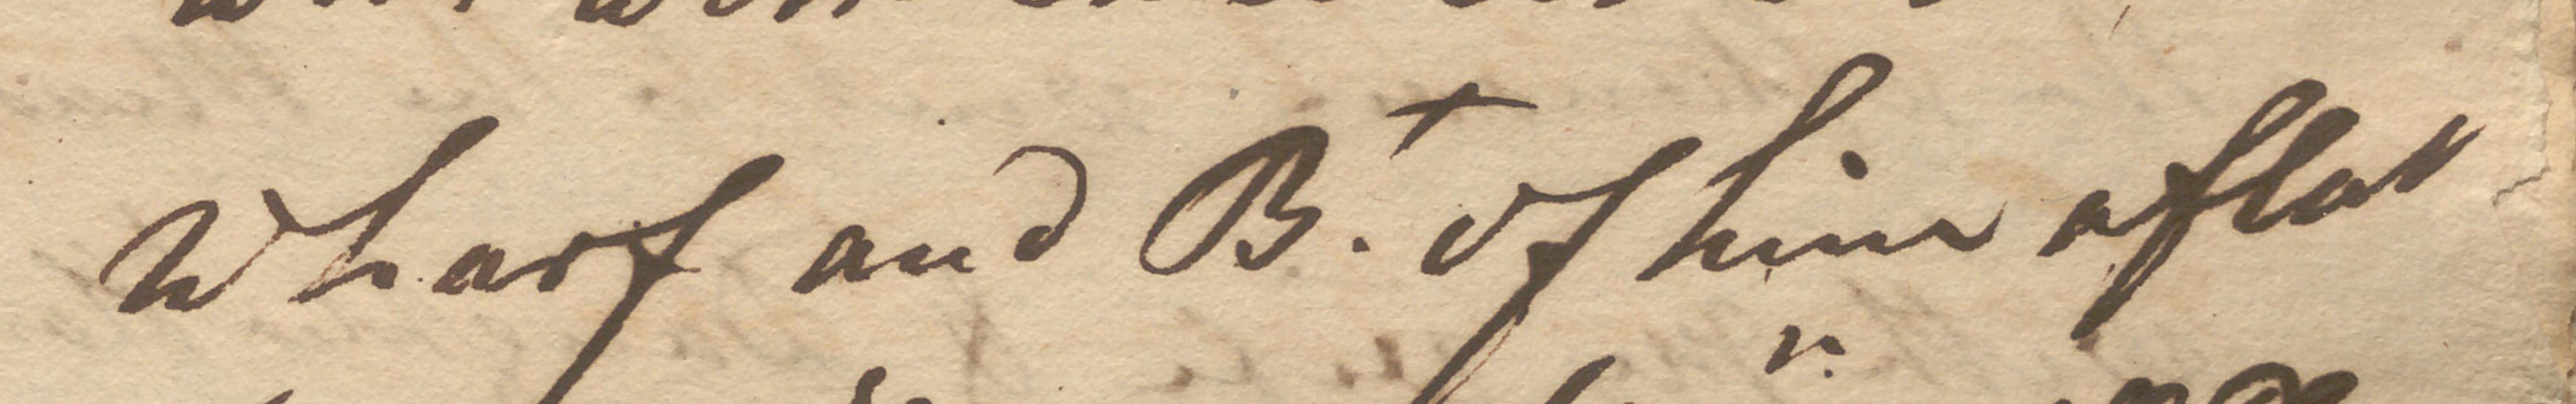wharf and B^t. of him a flat
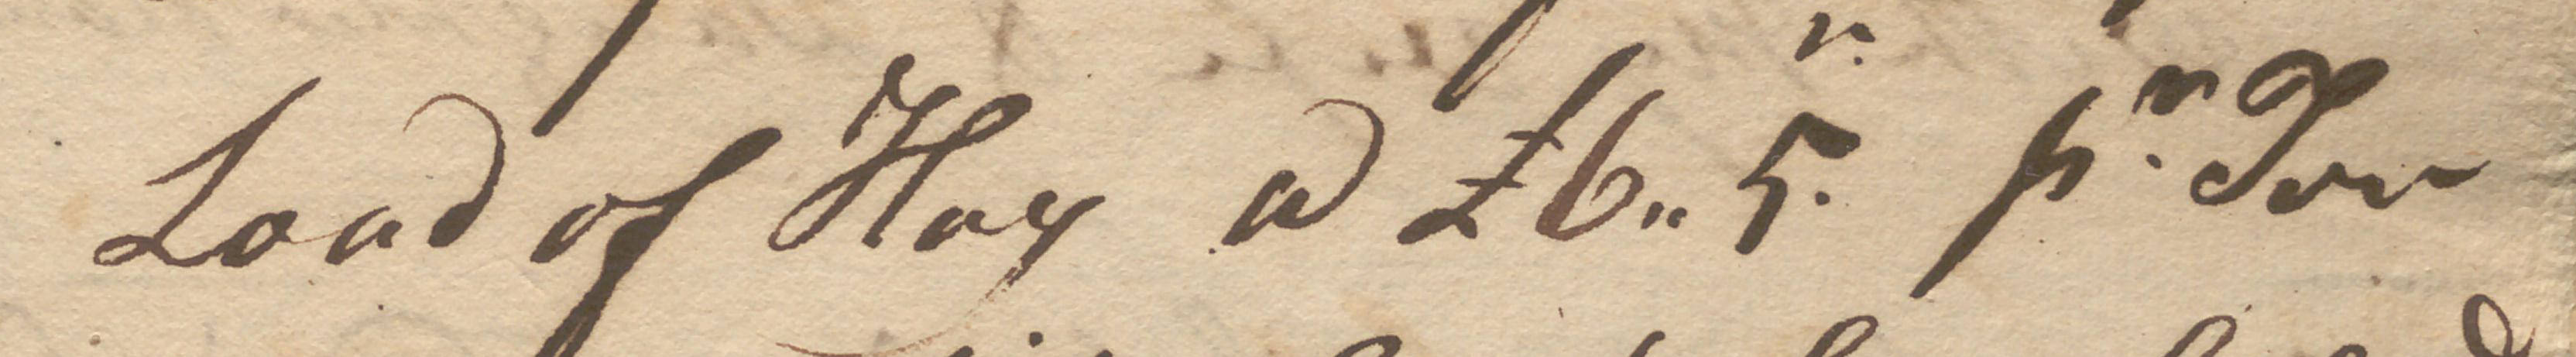Load of Hay @ £6.5. p^r. Ton
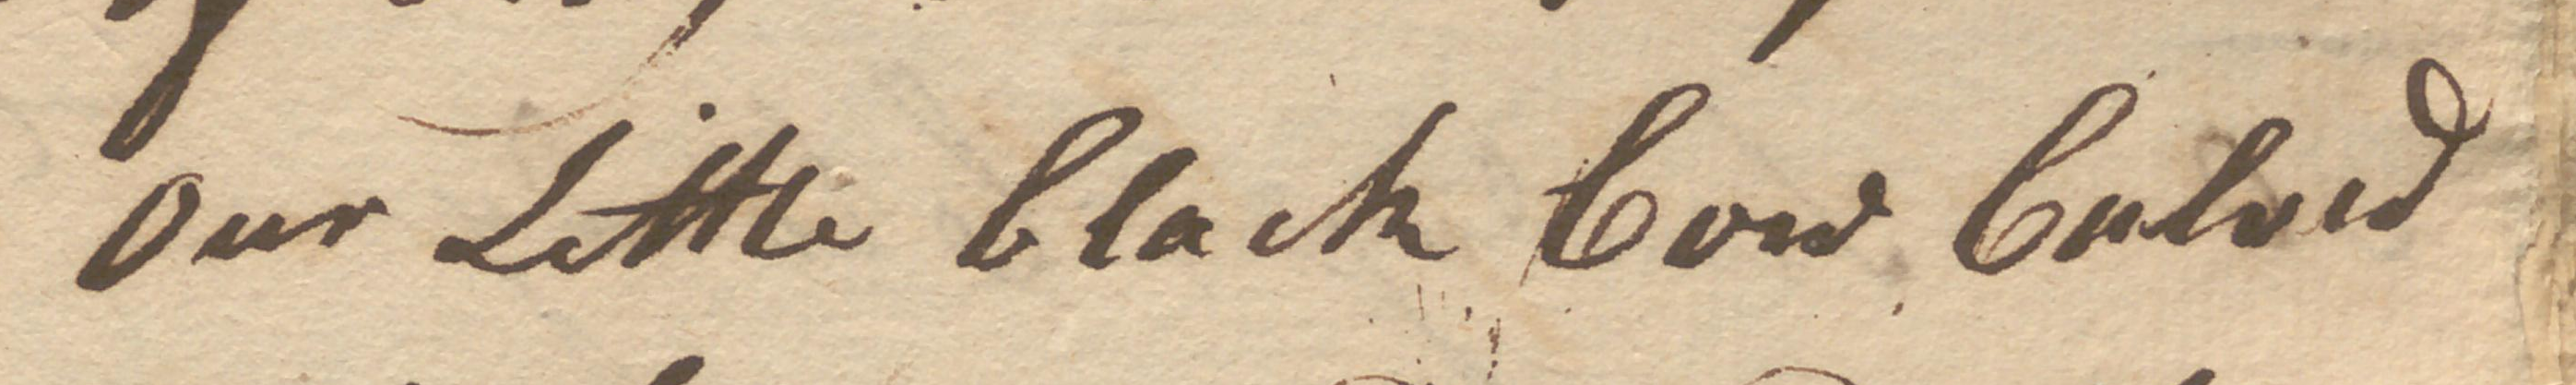our Little black Cow Calved
